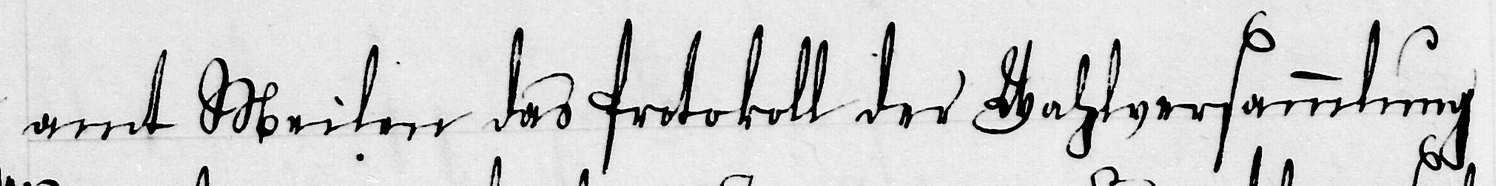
amt Meilen das Protokoll der Wahlversammlung
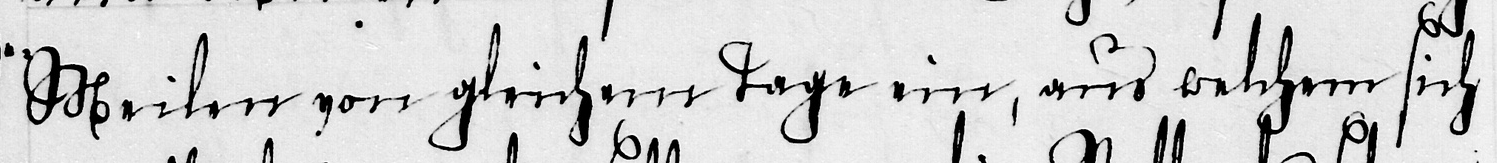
Meilen von gleichem Tage ein, aus welchem sich
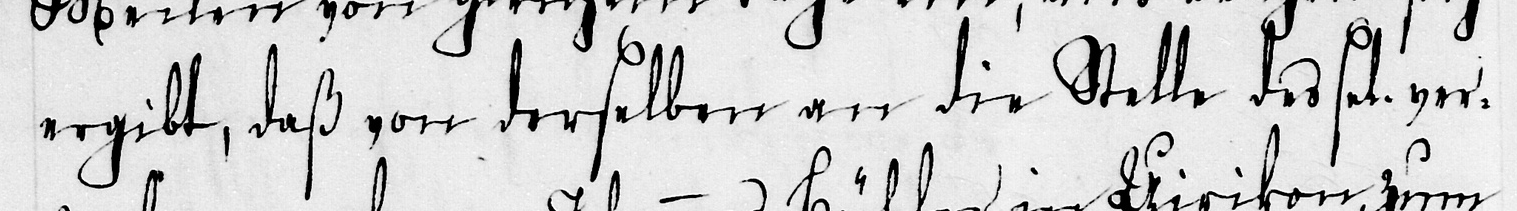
ergibt, daß von derselben an die Stelle des sel. ve¬
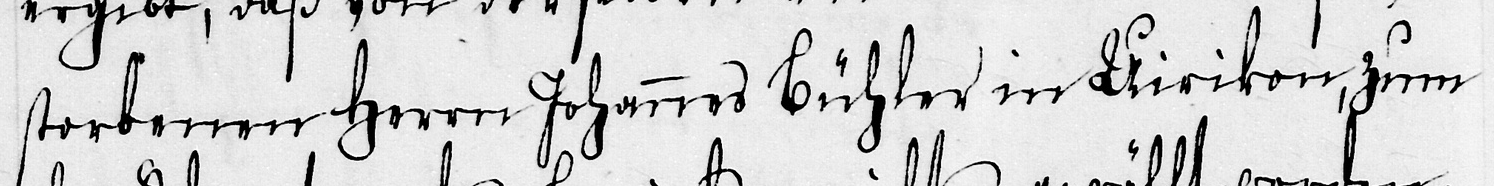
storbenen Herrn Johannes Bühler in Uirikon, zum
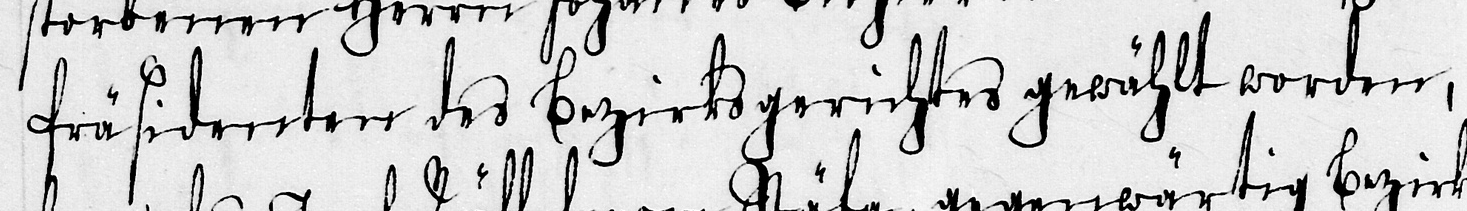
Präsidenten des Bezirksgerichtes gewählt worden,
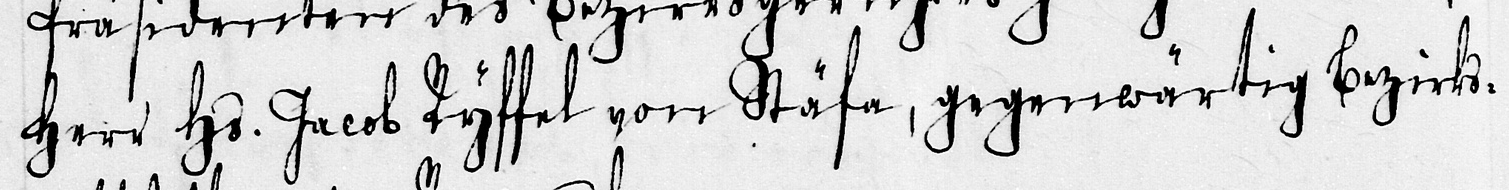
Herr Hs. Jacob Ryffel von Stäfa, gegenwärtig Bezirks¬
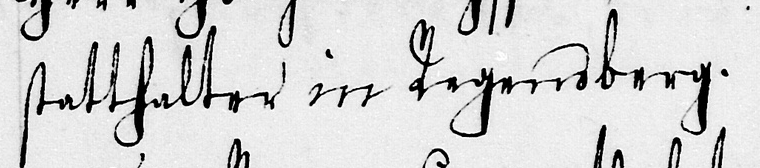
statthalter in Regensberg.
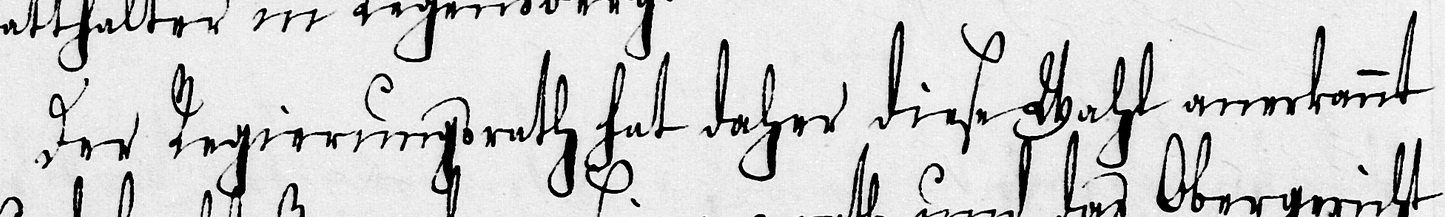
Der Regierungsrath hat daher diese Wahl anerkannt
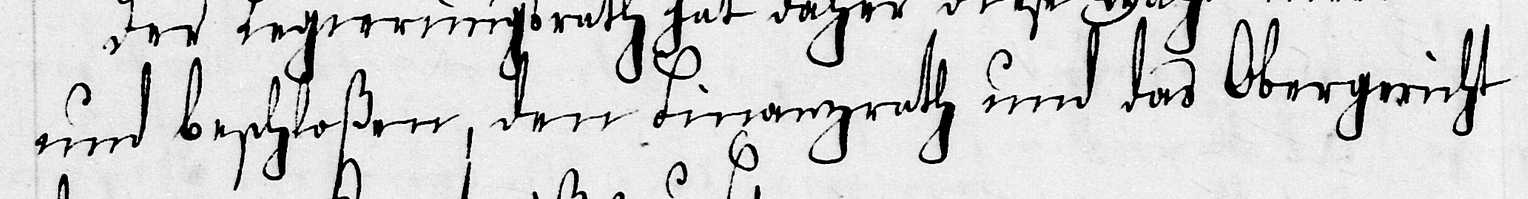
und beschloßen, den Finanzrath und das Obergericht
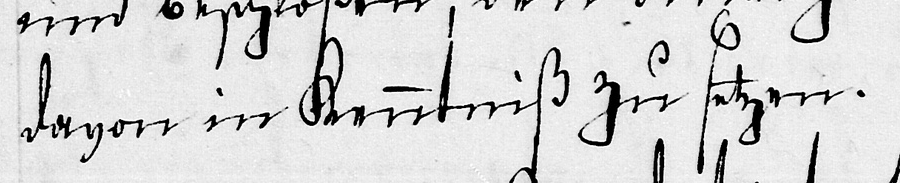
davon in Kenntniß zu setzen.
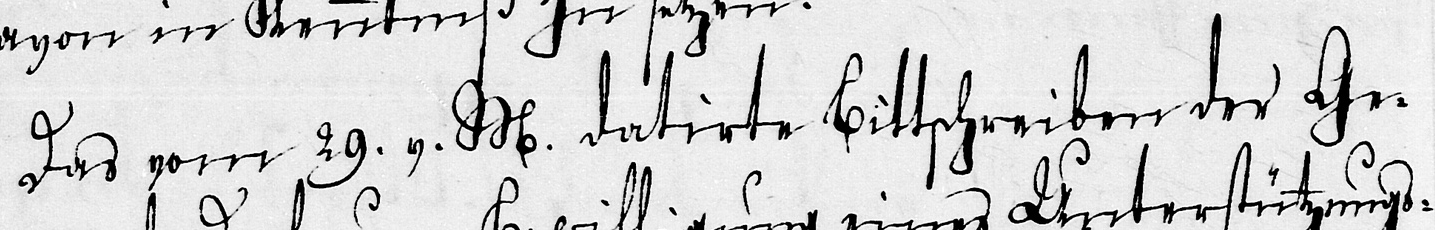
Das vom 29. v. M. datirte Bittschreiben der Ge¬
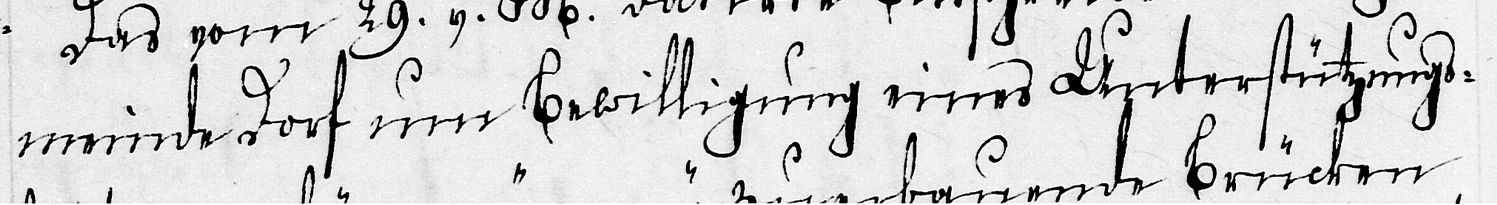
meinde Dorf um Bewilligung eines Unterstützungs¬
